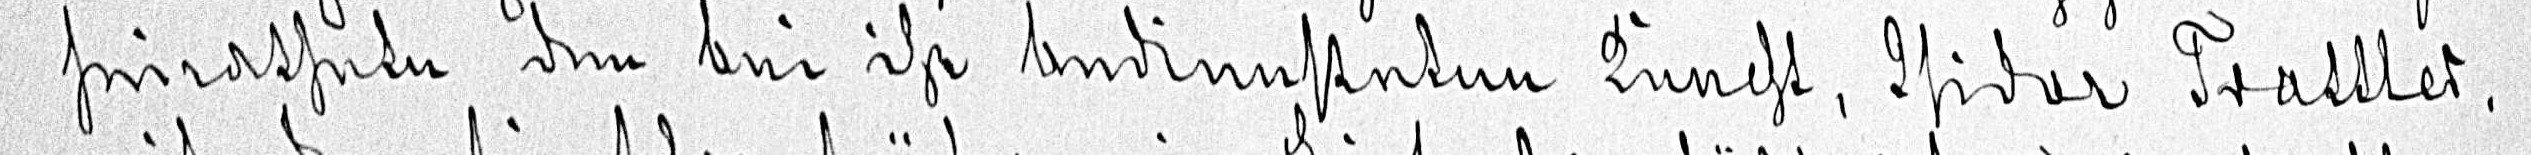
heirathete den bei ihr bediensteten Knecht, Isidor Trattler,
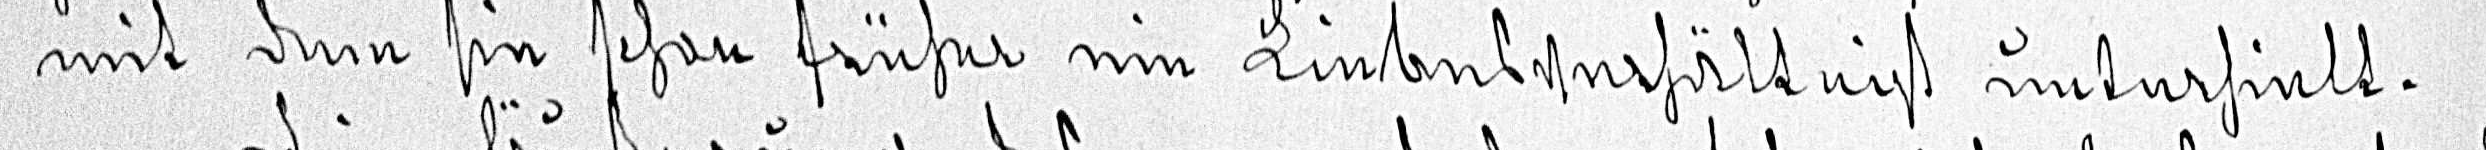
mit dem sie schon früher ein Liebesverhältniß unterhielt.
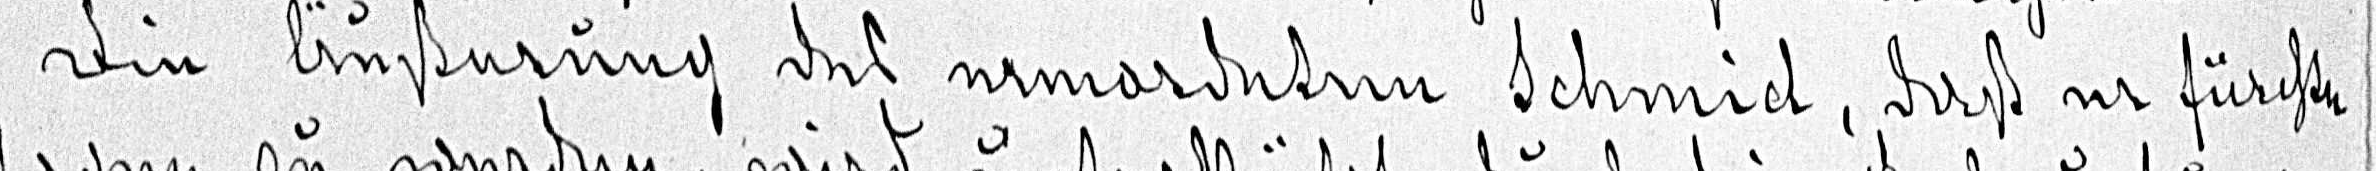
Die Äußerung des ermordeten Schmid, daß er fürchte
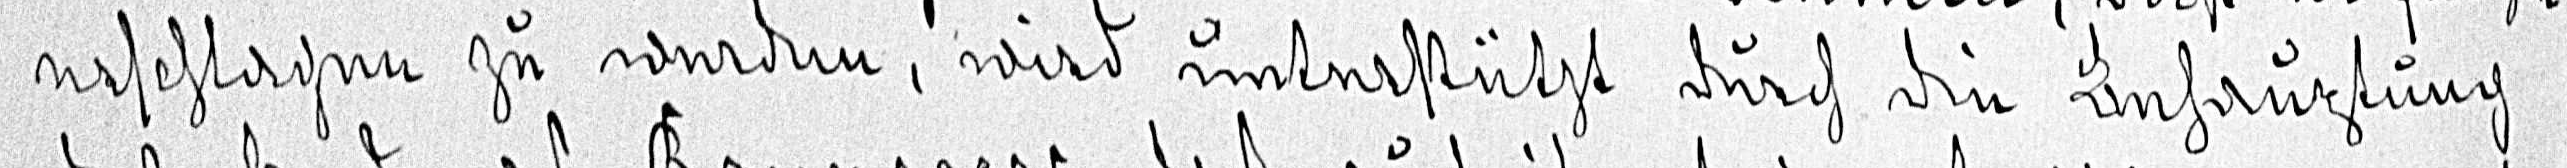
erschlagen zu werden, wird unterstützt durch die Behauptung
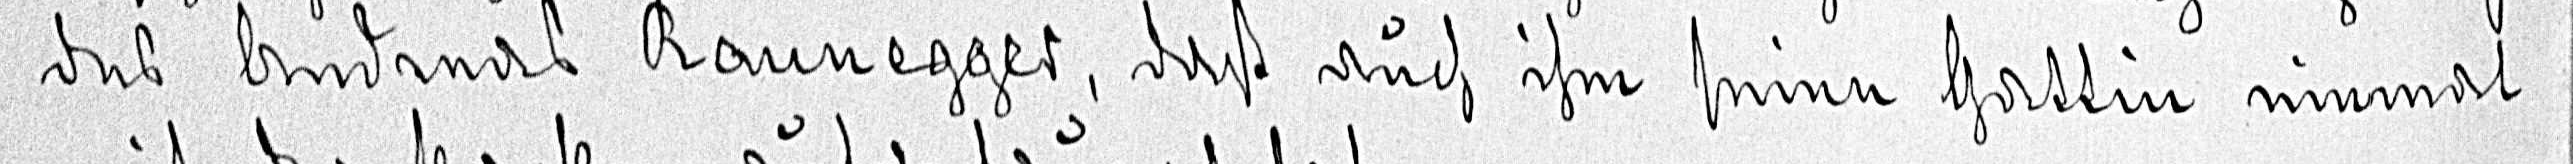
des Andreas Raunegger, daß auch ihm seine Gattin einmal
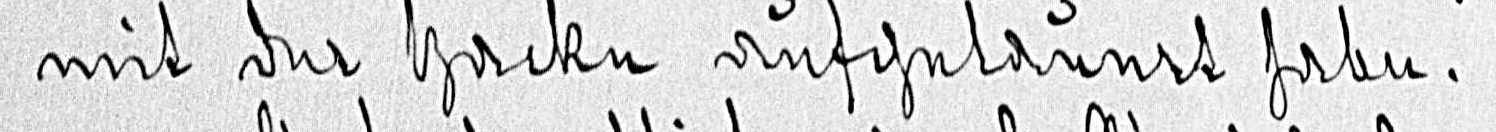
mit der Hacke aufgelauert habe.
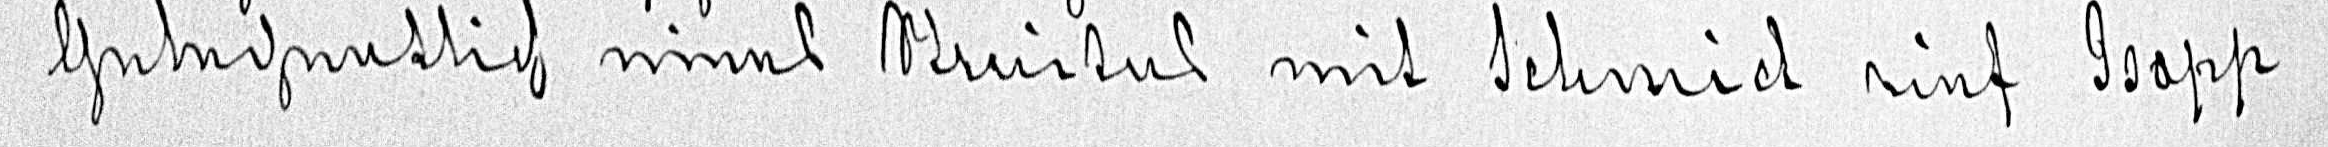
Gelegentlich eines Streites mit Schmid rief Isopp
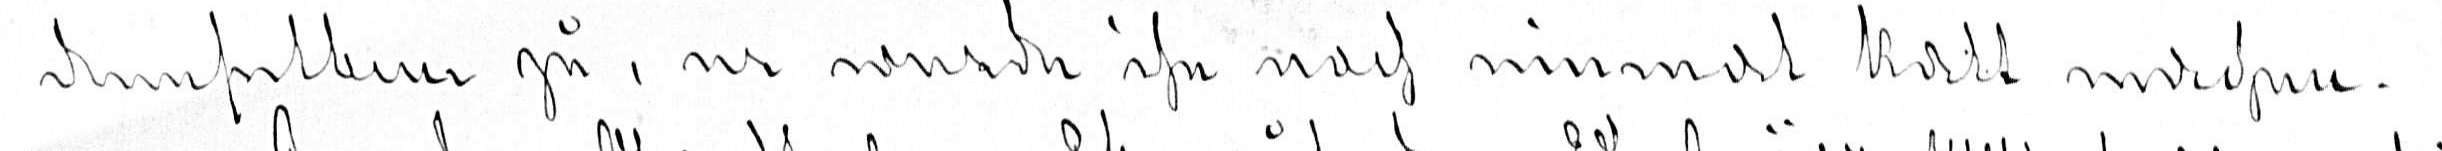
demselben zu, er wurde ihn nach einmal kalt machen.
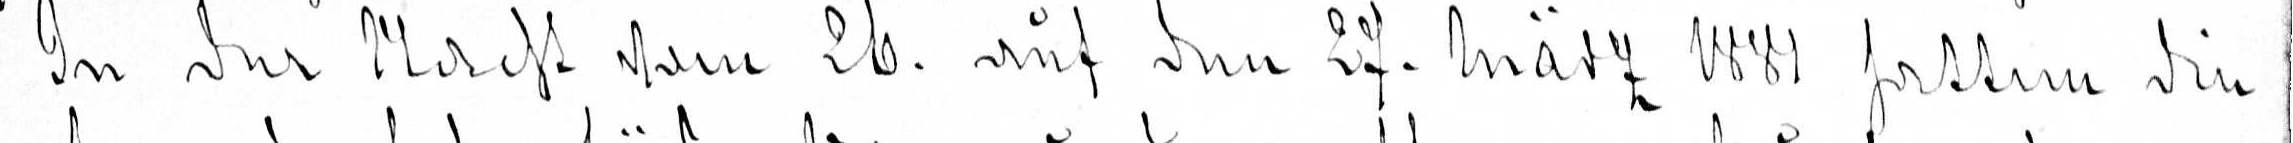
In der Nacht vom 26. Auf den 27. März 1881 hatten die
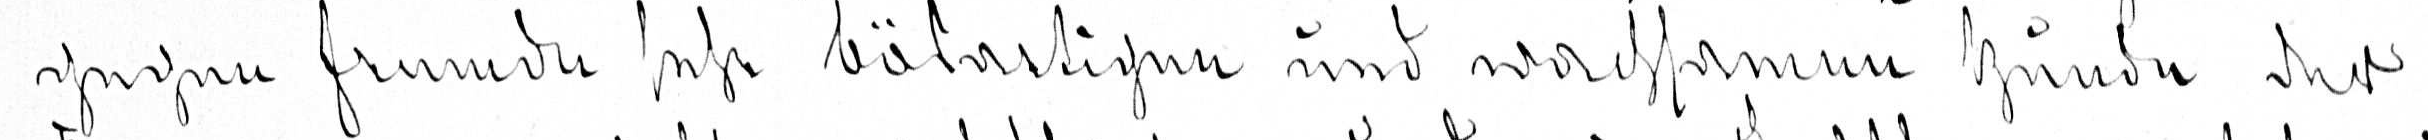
gegen fremde sehr bösartigen und wachsamen Hunde der
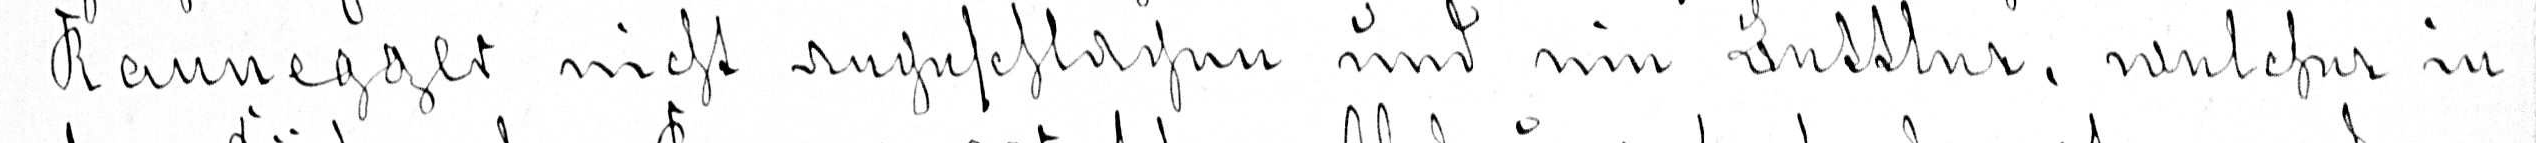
Raunegger nicht angeschlagen und ein Bettler, welcher in
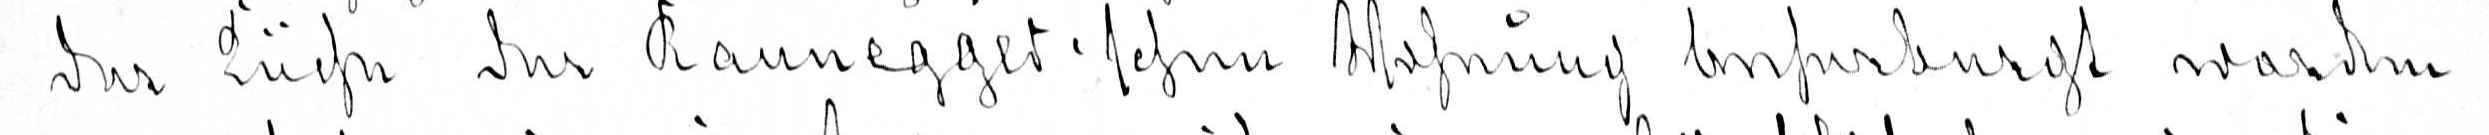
der Küche der Raunegger’schen Wohnung beherbergt worden
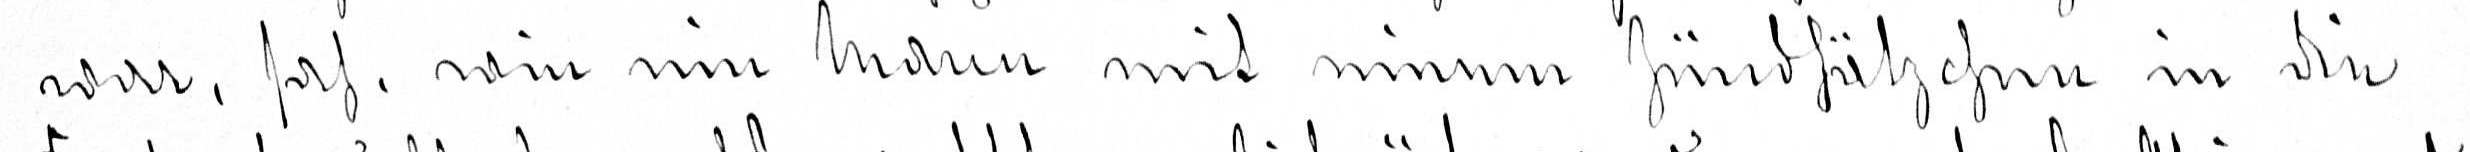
war, sah, wie ein Mann mit einem Zündhölzchen in die
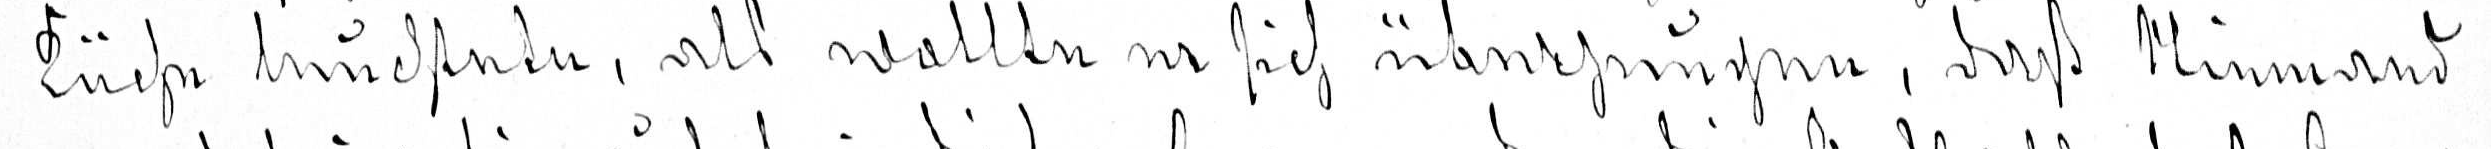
Küche leuchtete, als wollte er sich überzeugen, daß Niemand
